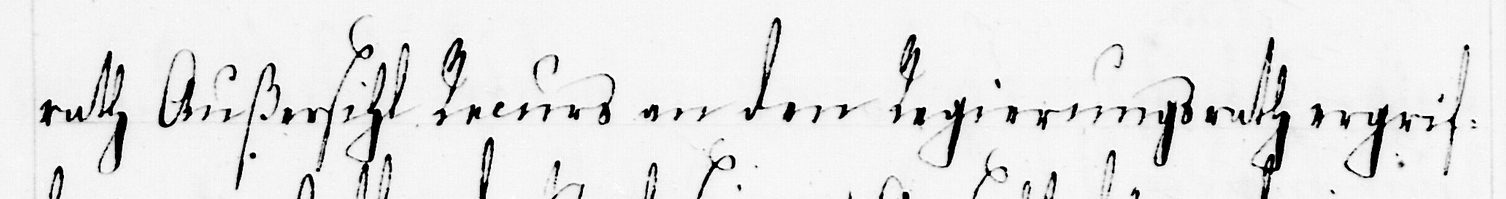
rath Außersihl Recurs an den Regierungsrath ergrif¬
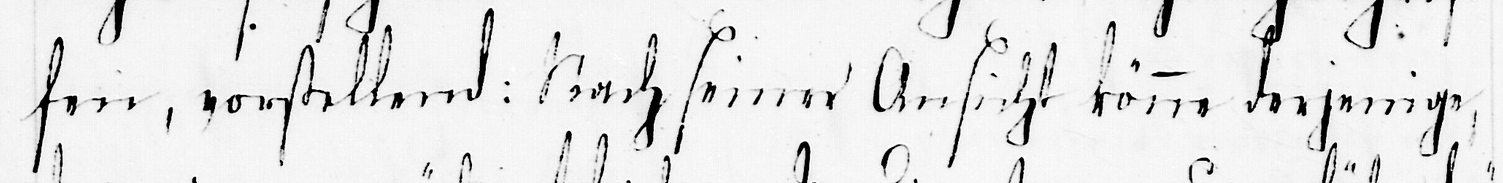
fen, vorstellend: Nach seiner Ansicht könne derjenige,
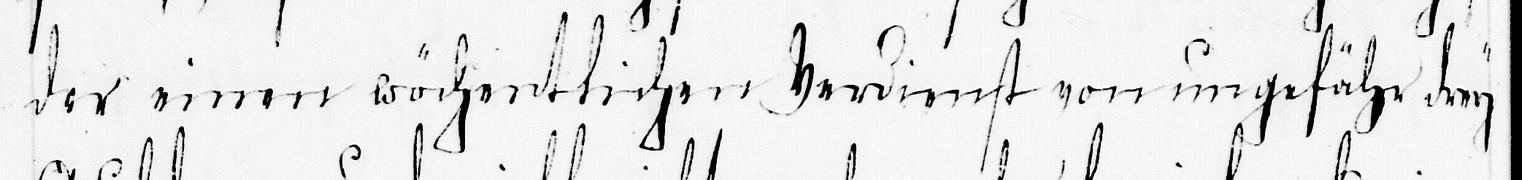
der einen wöchentlichen Verdienst von ungefähr drey
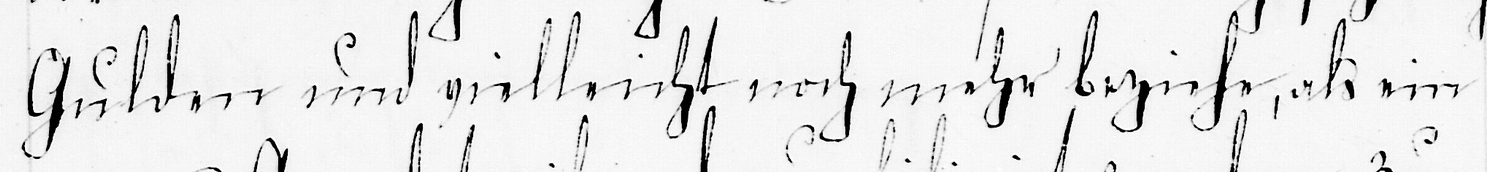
Gulden und vielleicht noch mehr beziehe, als ein
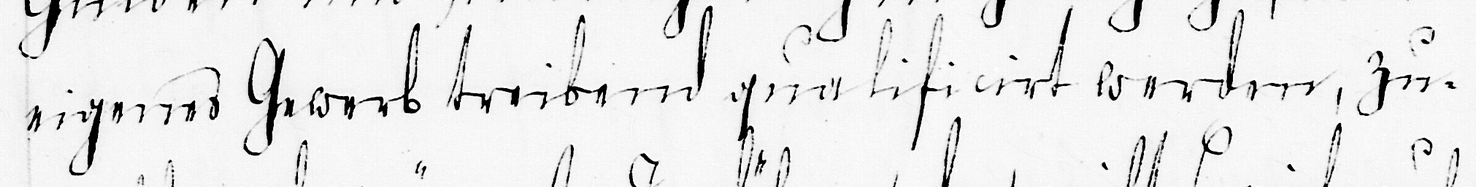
eigenes Gewerb treibend qualificirt werden, zu¬
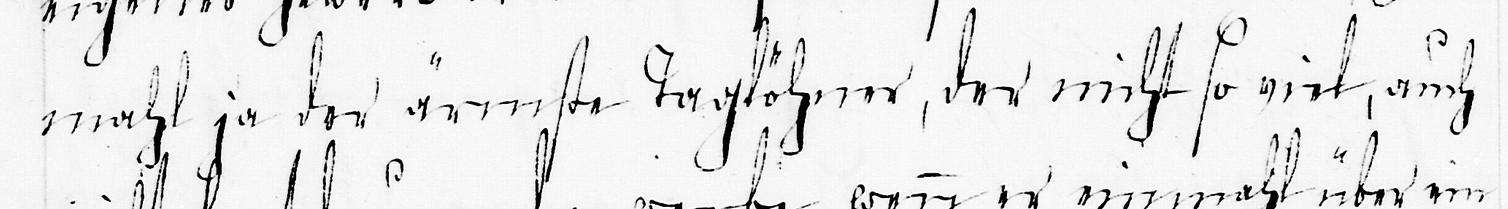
mahl ja der ärmste Taglöhner, der nicht so viel, auch
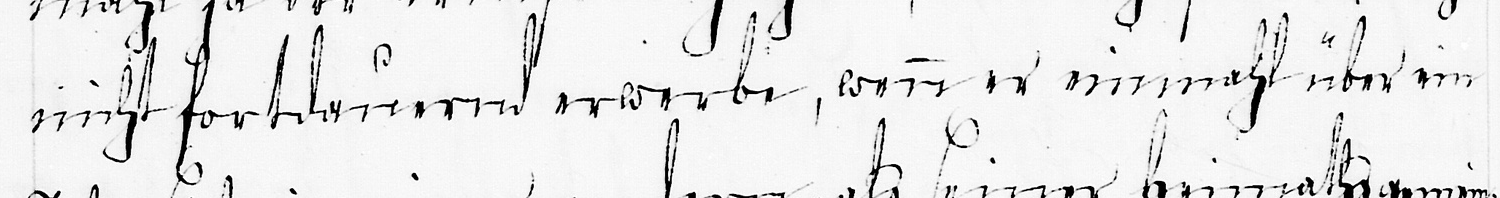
nicht fortdauernd erwerbe, wenn er einmahl über ein
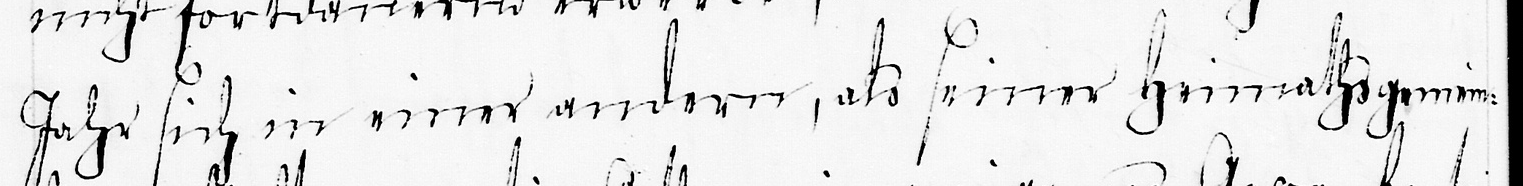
Jahr sich in einer andern, als seiner Heimathsgemein¬
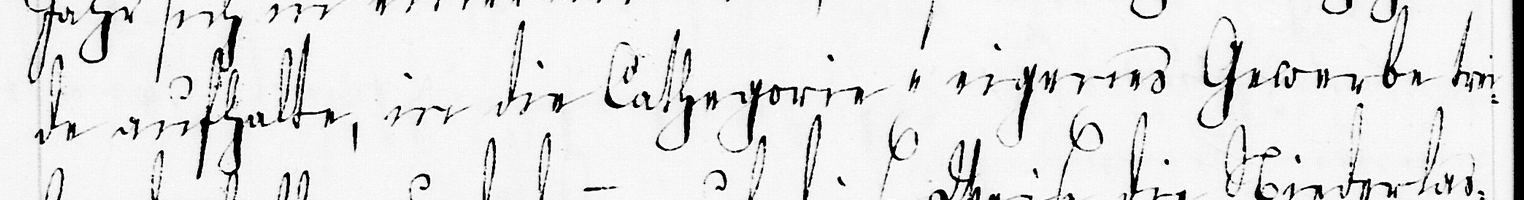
de aufhalte, in die Cathegorie „eigenes Gewerbe trei¬
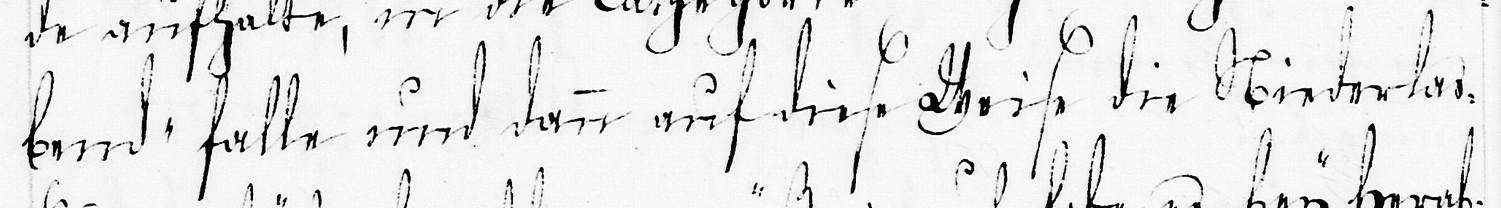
bend“ falle und dann auf diese Weise die Niederlaß¬
